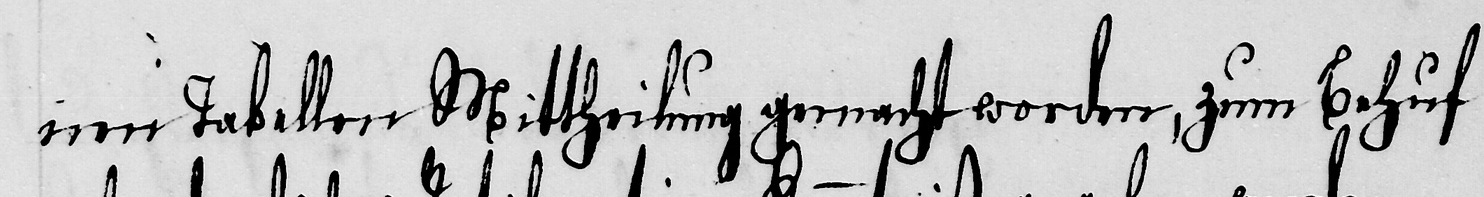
nenTabellen Mittheilung gemacht worden, zum Behuf
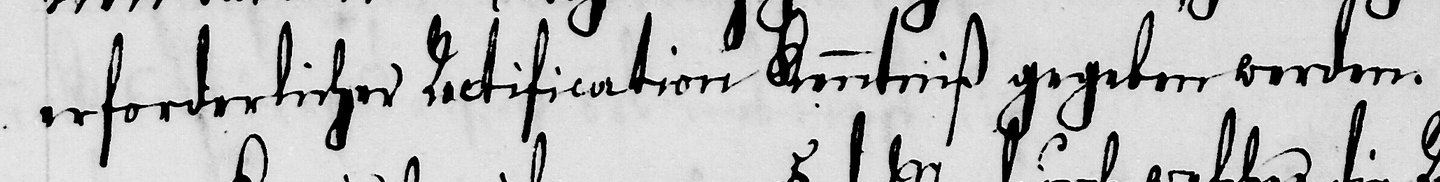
erforderlicher Rectification Kenntniß gegeben werden.
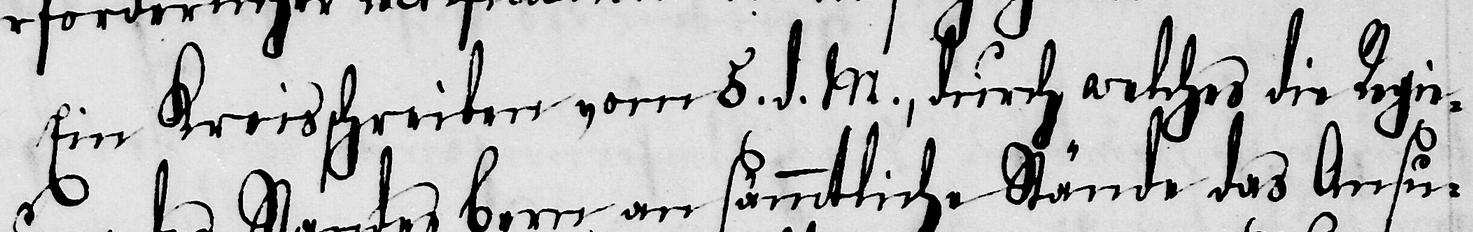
Ein Kreisschreiben vom 5. d. M., durch welches die Regie¬
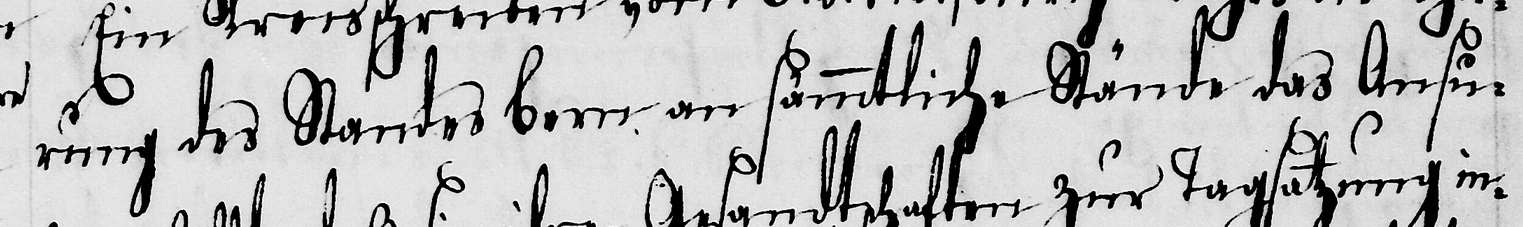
rung des Standes Bern an sämmtliche Stände das Ansuc¬
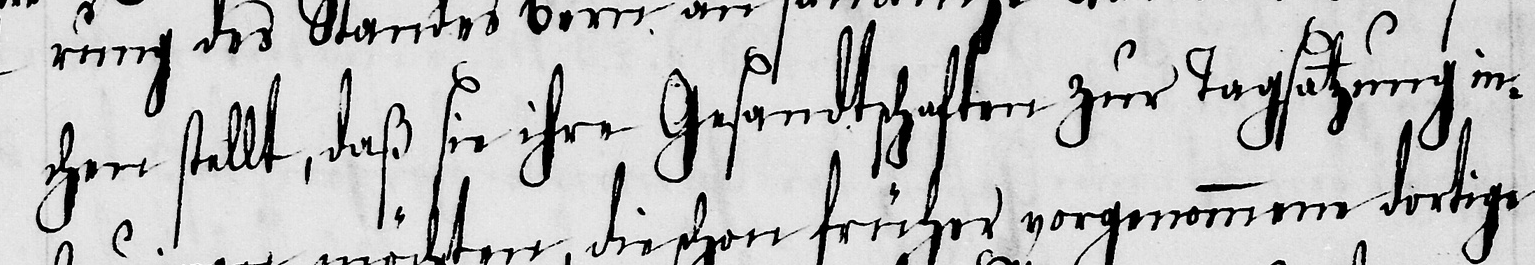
hen stellt, daß sie ihre Gesandtschaften zur Tagsatzung in¬
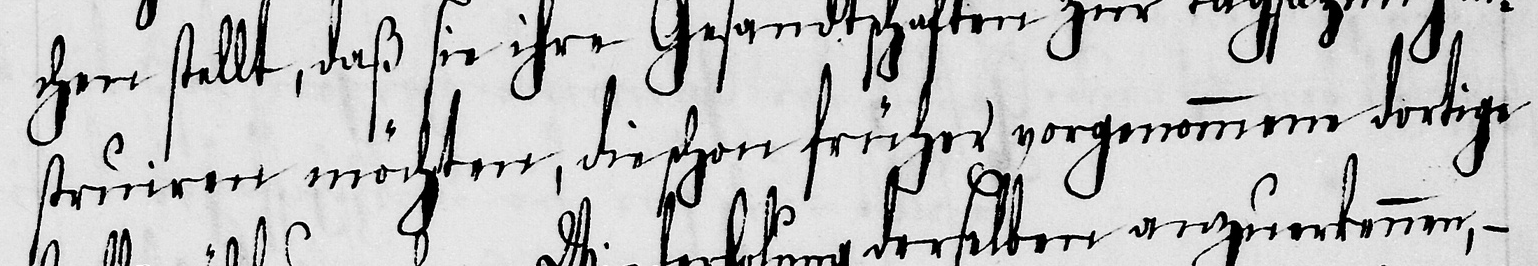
struiren möchten, die schon früher vorgenommene dortige
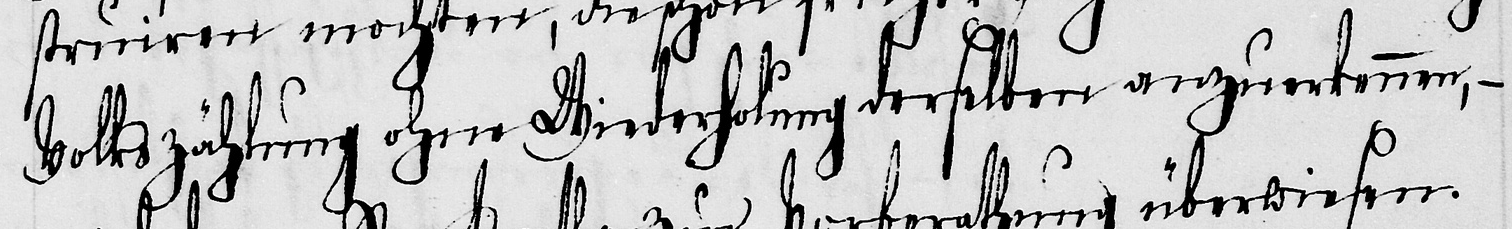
Volkszählung ohne Wiederholung derselben anzuerkennen,
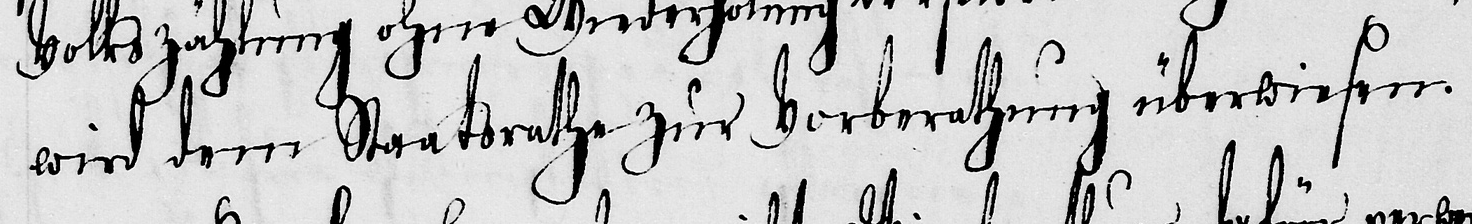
wird dem Staatsrathe zur Vorberathung überwiesen.
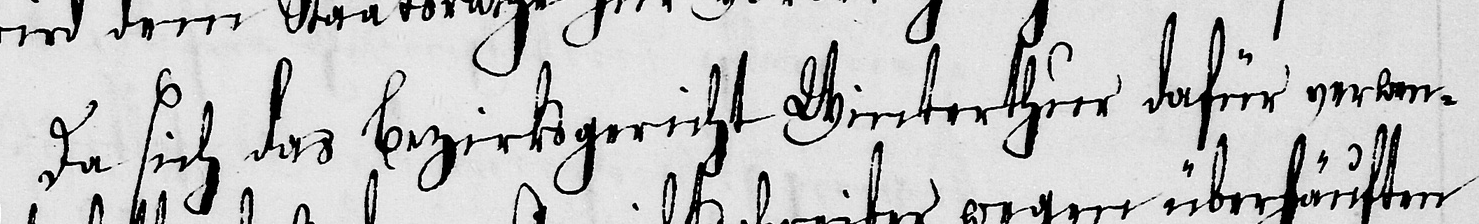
Da sich das Bezirksgericht Winterthur dafür verwen¬
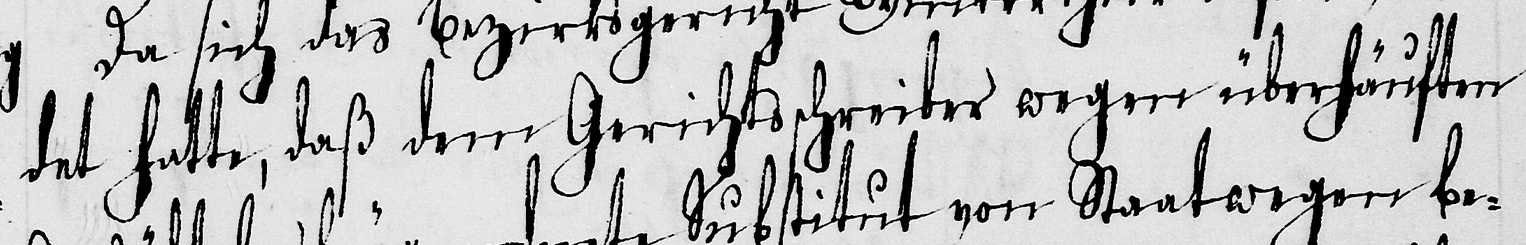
det hatte, daß dem Gerichtsschreiber wegen überhäuften
